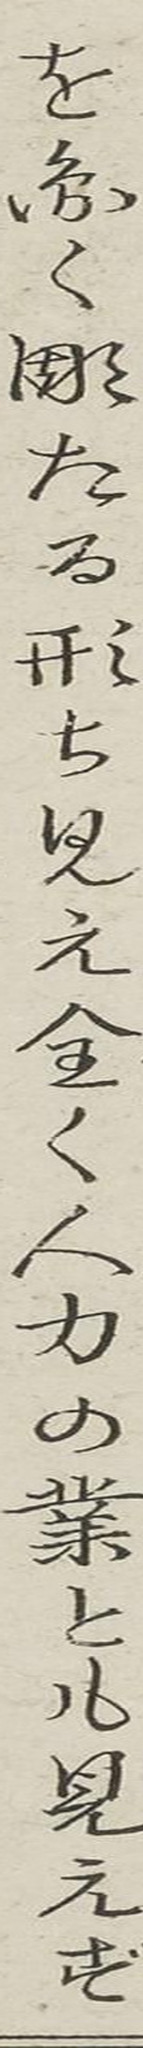を円く彫たる形ち見え全く人力の業とも見えず

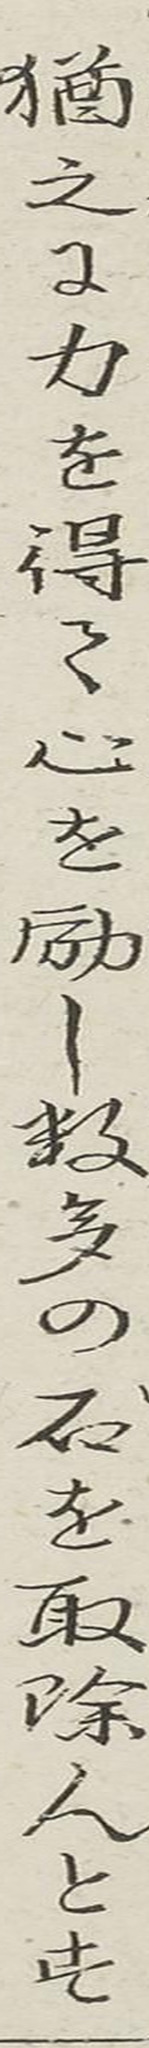猶之に力を得て心を励し数多の石を取除んとす
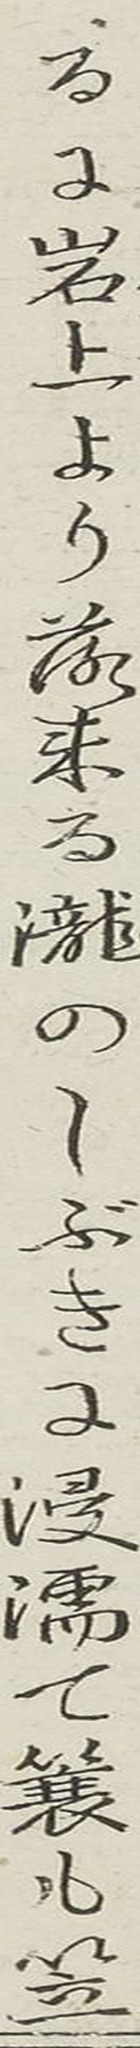るに岩上より落来る瀧のしぶきに浸濡て蓑も笠
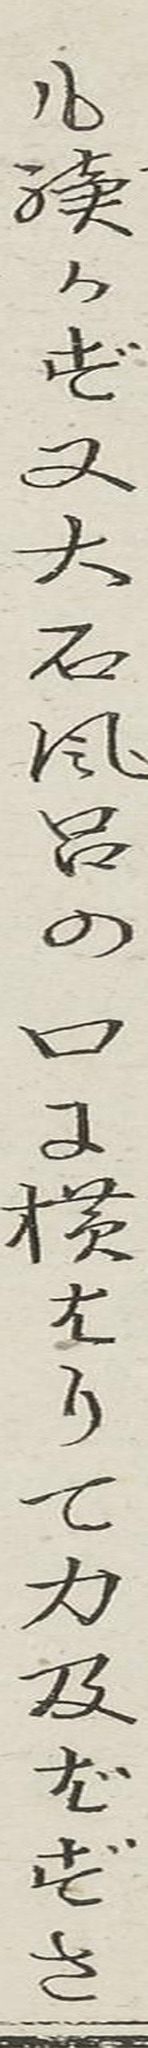も続かず又大石風呂の口に横はりて力及ばずさ
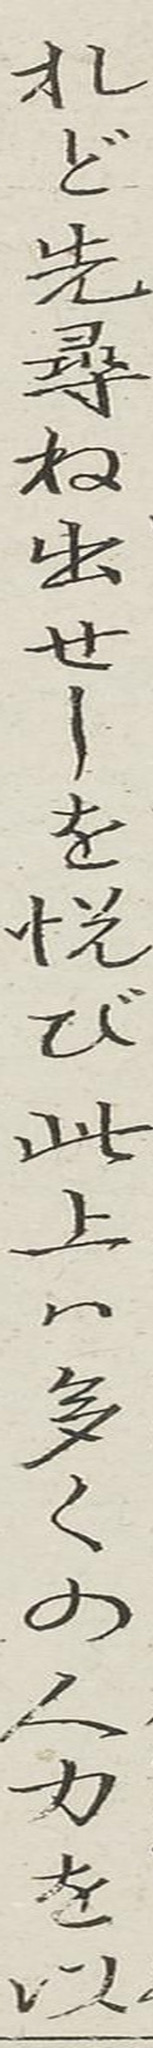れど先尋ね出せしを悦び此上は多くの人力を以
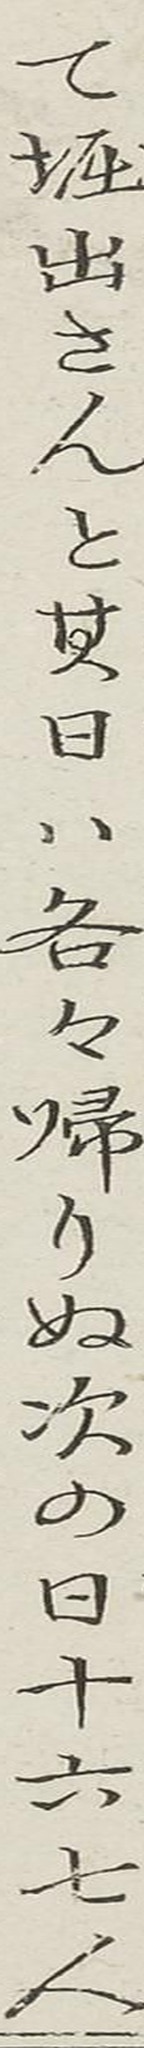て堀出さんと其日は各々帰りぬ次の日十六七人
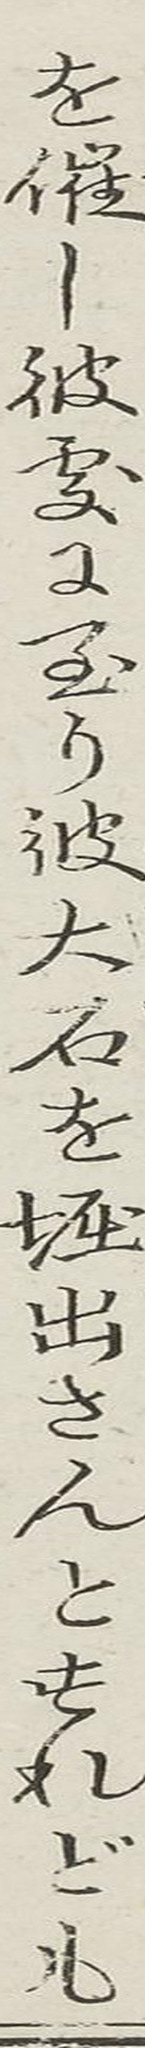を催し彼處に至り彼大石を堀出さんとすれども
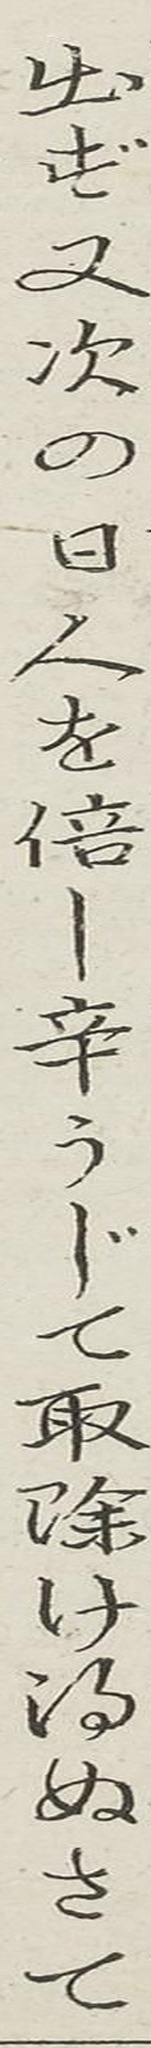出ず又次の日人を倍し辛うじて取除け得ぬさて
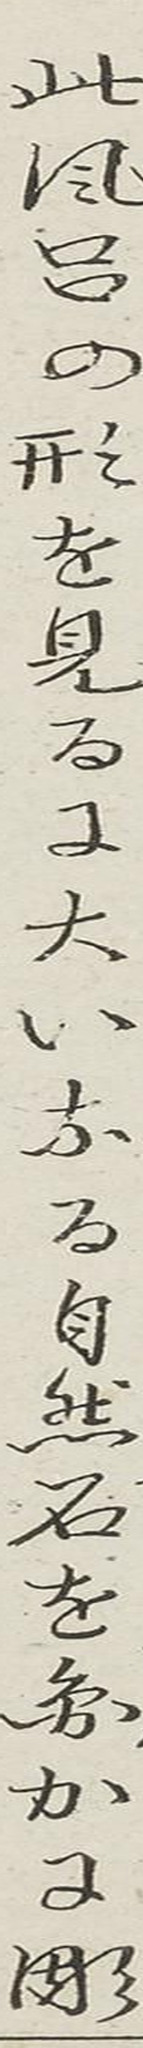此風呂の形を見るに大いなる自然石を圓かに彫
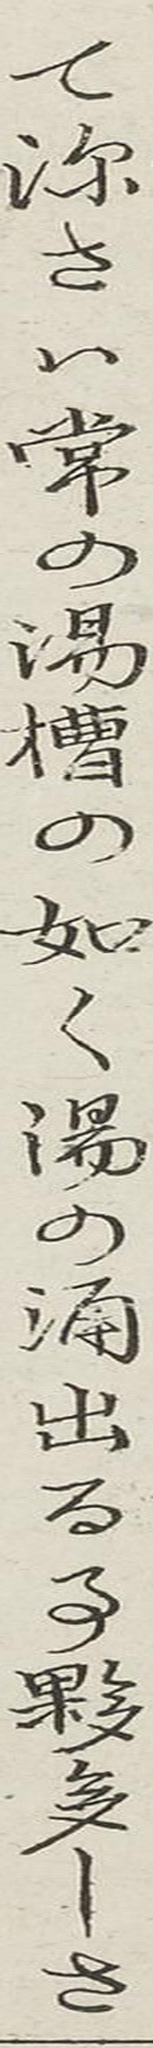て深さは常の湯槽の如く湯の湧出る事夥多しさ
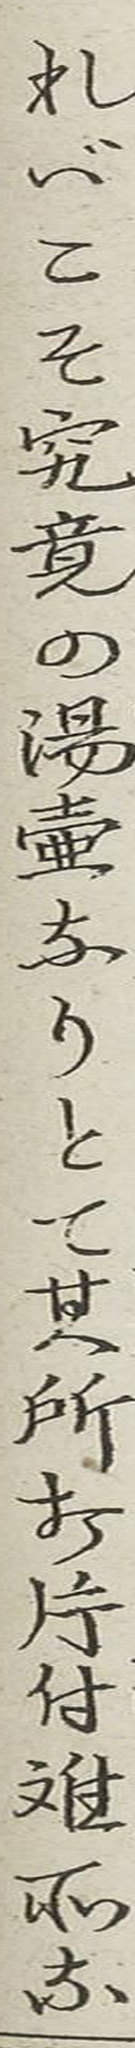ればこそ究竟の湯壷なりとて其所打片付難所な
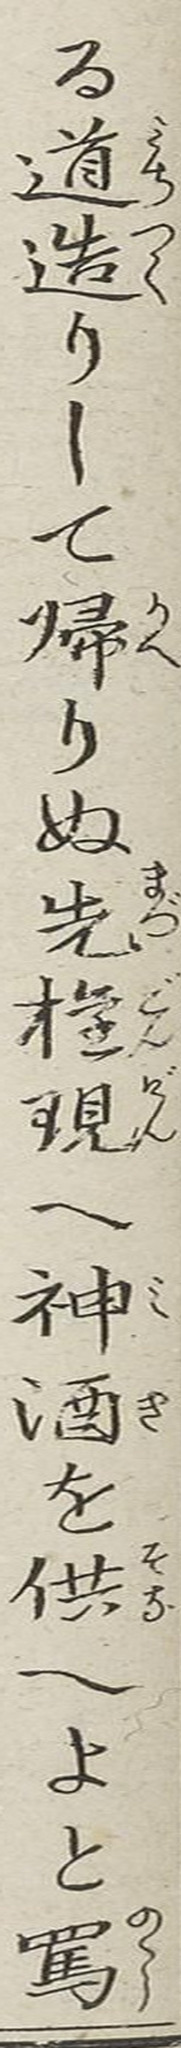る道造りして帰りぬ先権現へ神酒を供へよと罵
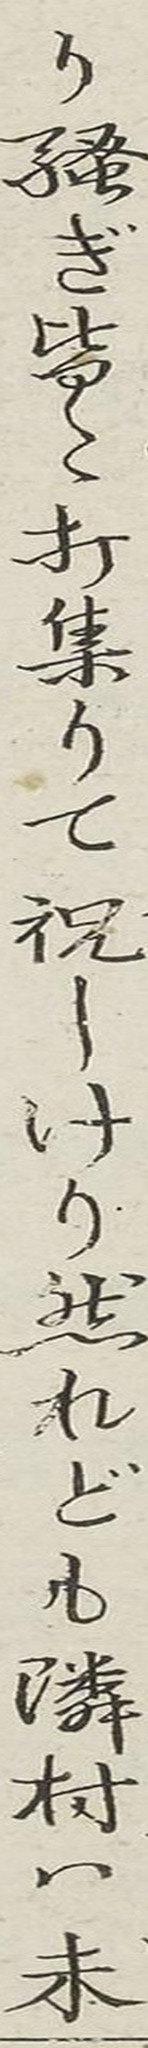り騒ぎ皆々打集りて祝しけり然れども隣村は未
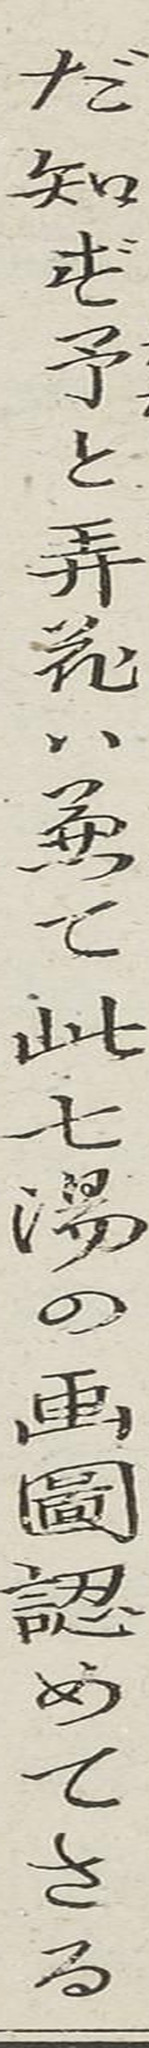だ知ず予と弄花は兼て此七湯の画圖認めてさる
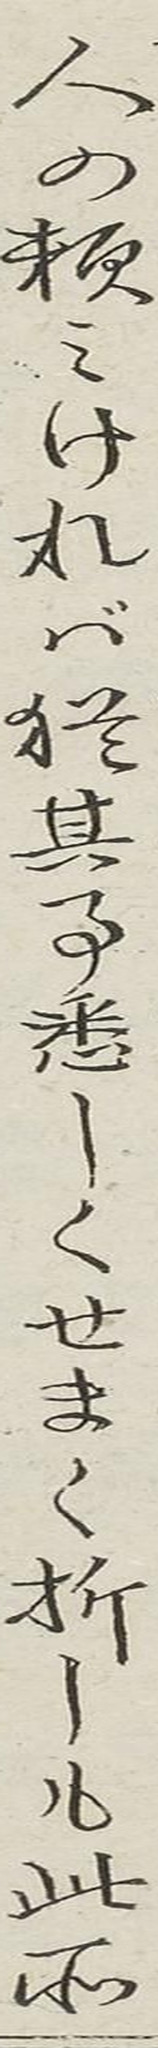人の頼みければ猶其事悉しくせまく折しも此所
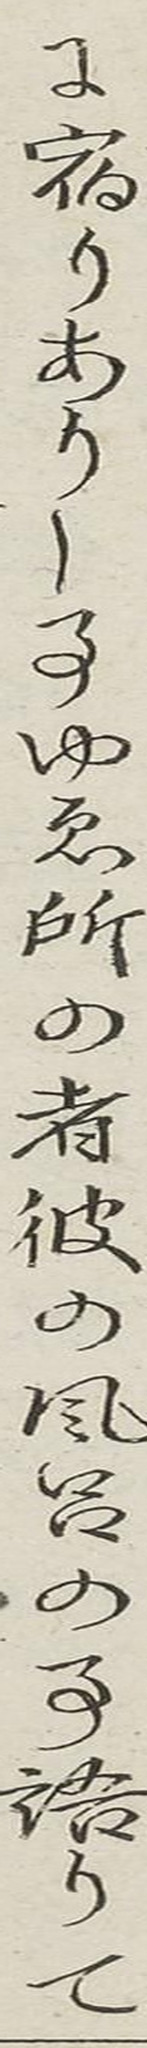に宿りありし事ゆゑ所の者彼の風呂の事語りて
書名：箱根温泉誌　全
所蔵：東京大学地震研究所図書室 Earthquake Research Institute Library, The University of Tokyo, JAPAN
